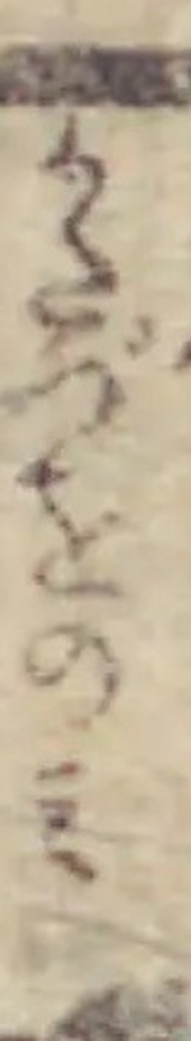かたづをのみ
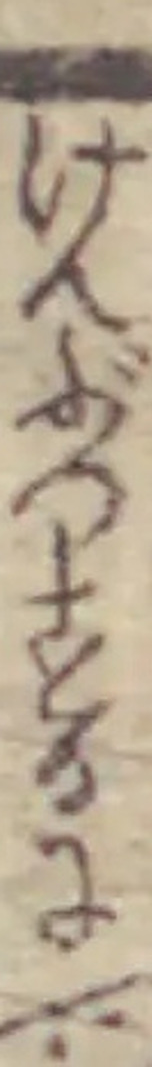けんぶつするに
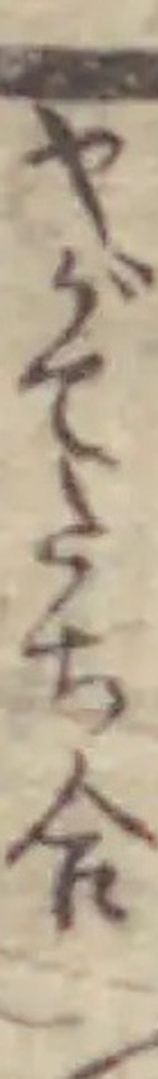やがてたち合
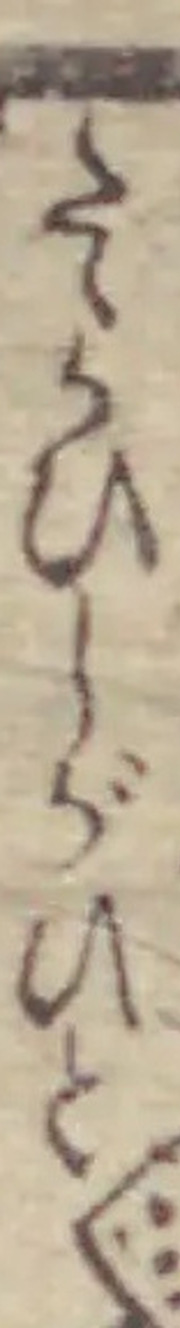たゝかひしがひと
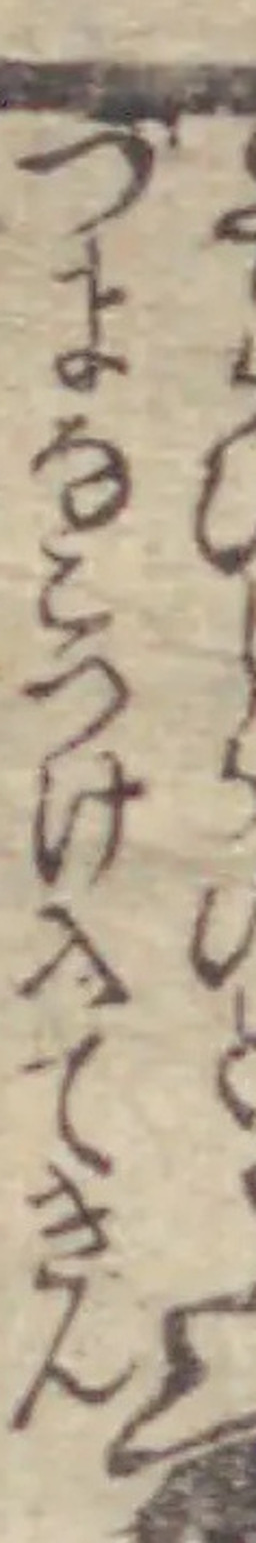つまなこつけ入てきん
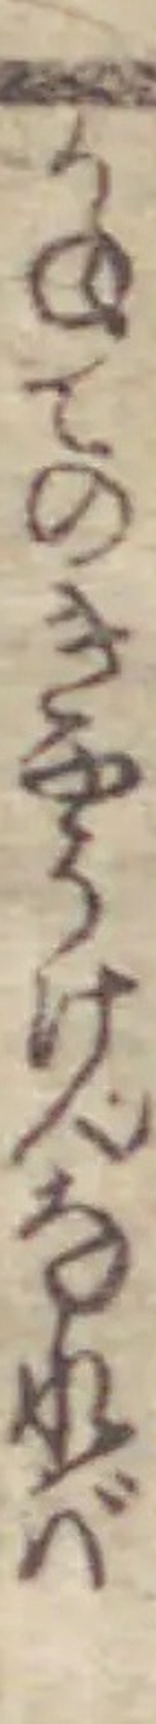かねてのきやうけんなれば
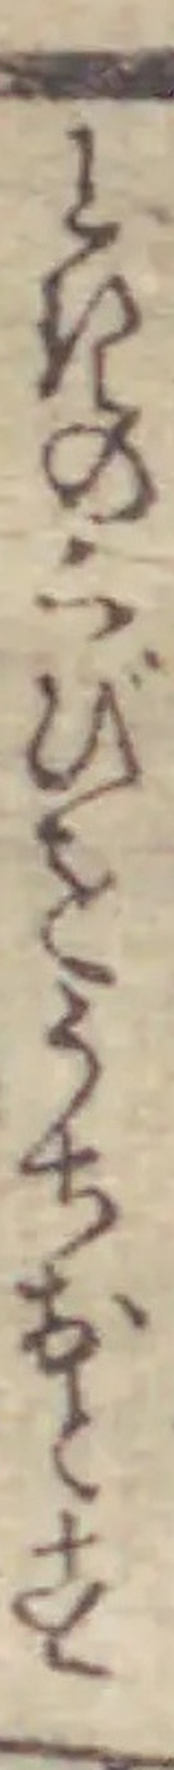ときのくびをうちおとす
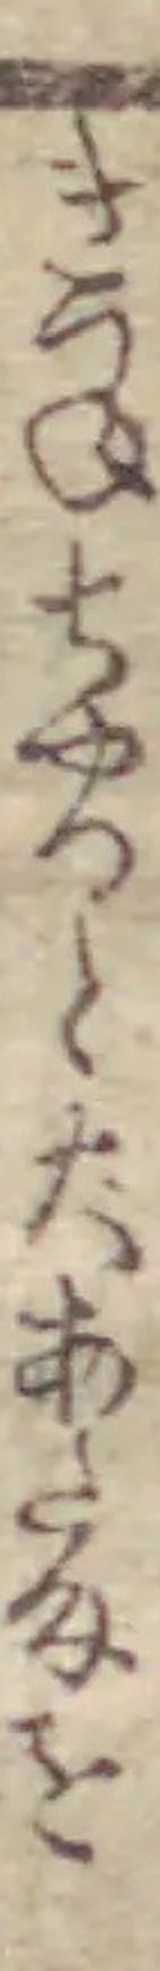きつねちやつと大あたまを
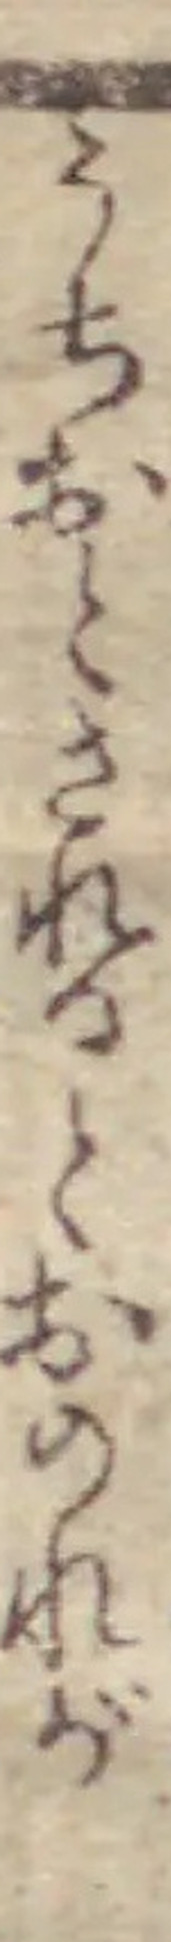うちおとされるとおのれが
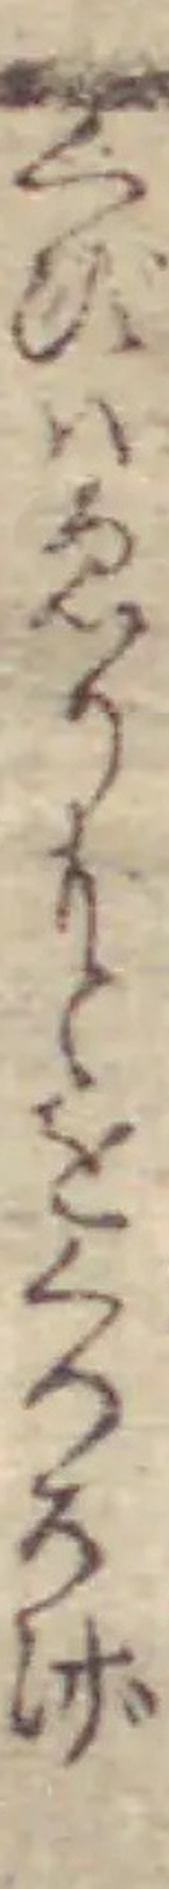くびはえりもとをくつろげ
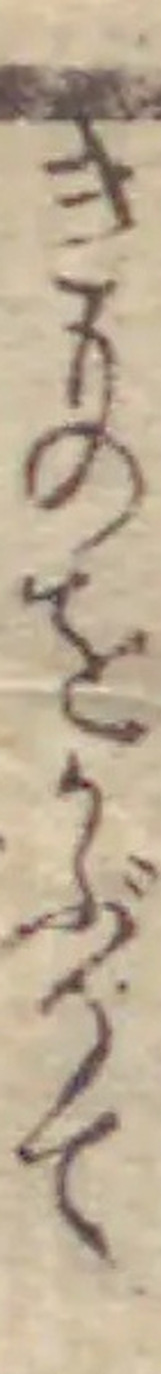きものをかぶりて
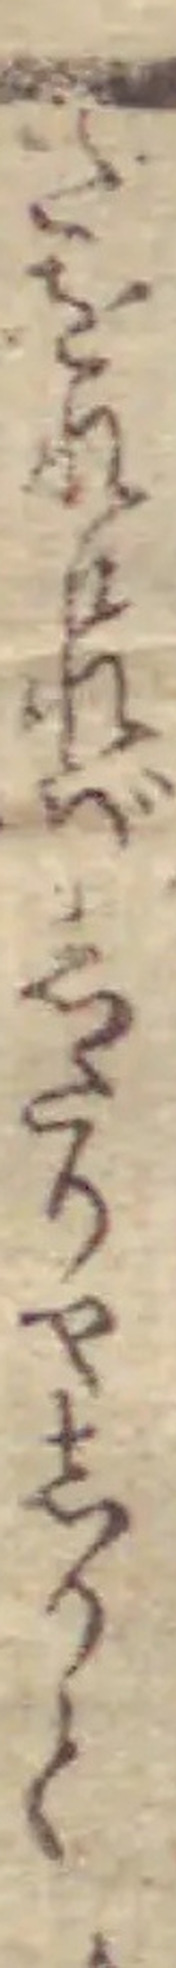たをれければしたりやしかと
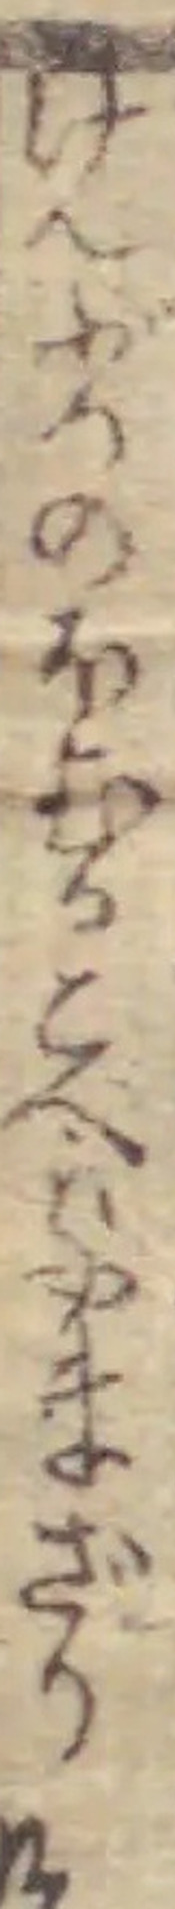けんぶつのほむるこへはやまざり

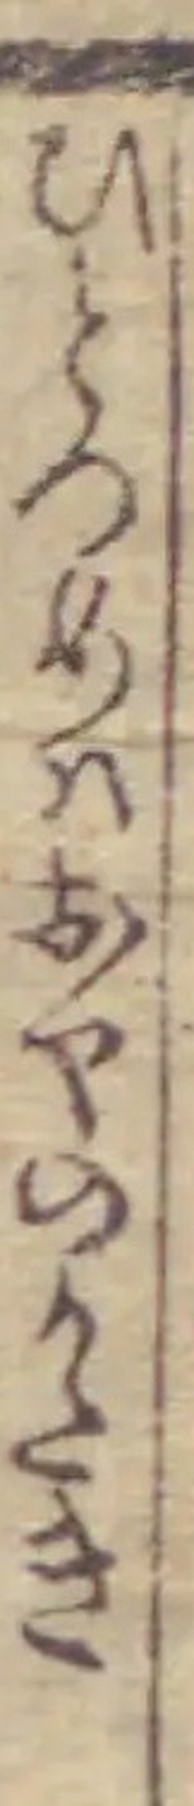ひとつめはおやのかたき
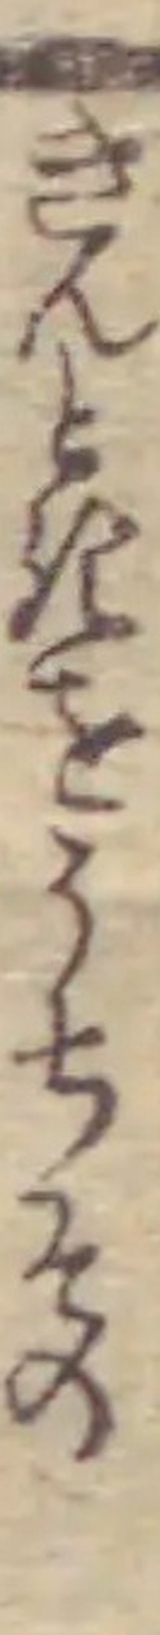きんときをうちその
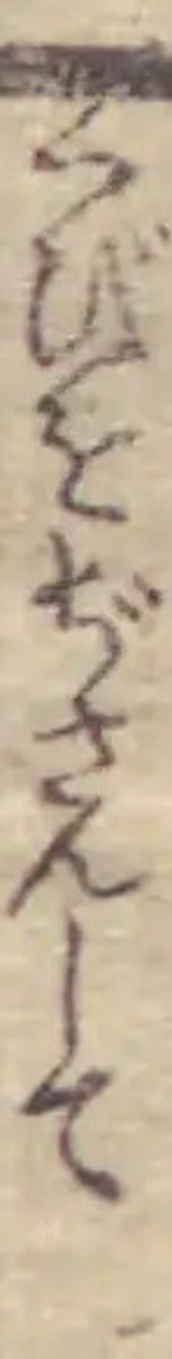くびをぢさんして
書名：化物敵討 2巻
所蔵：国立国会図書館 National Diet Library, JAPAN
